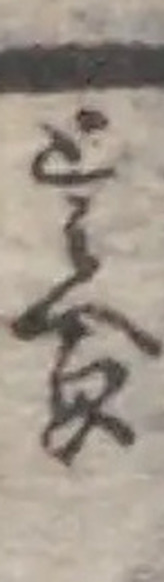とみへ顔
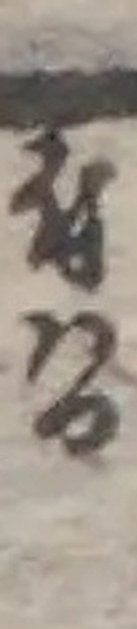付わる
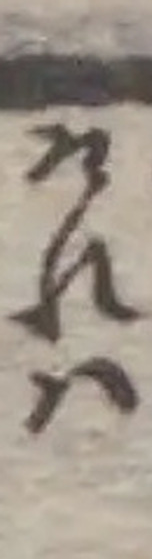けれは
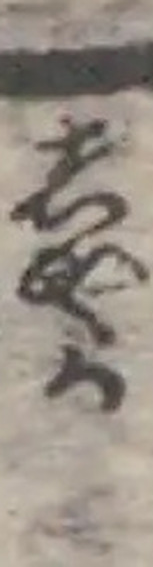しやか
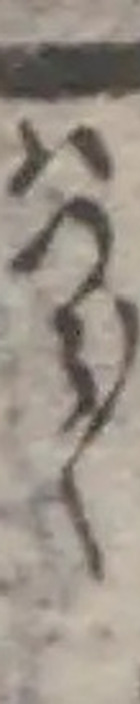はつら〳〵
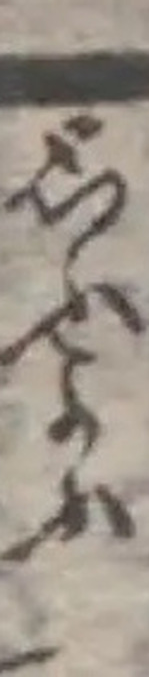思ふよふ
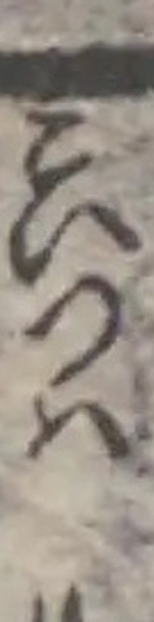こいつは
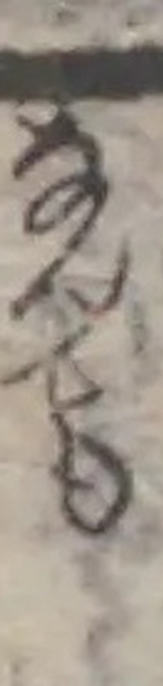なんても
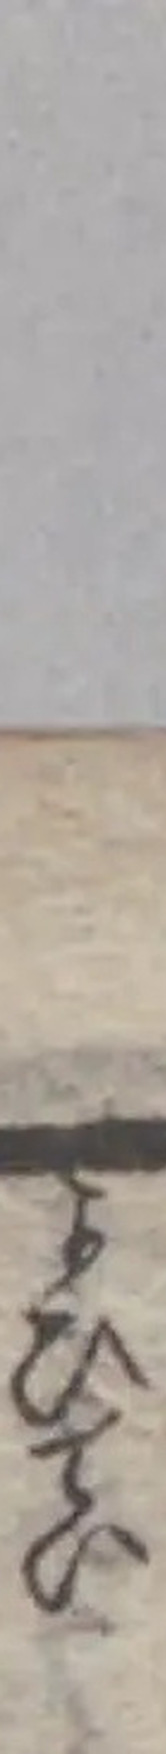よひてい
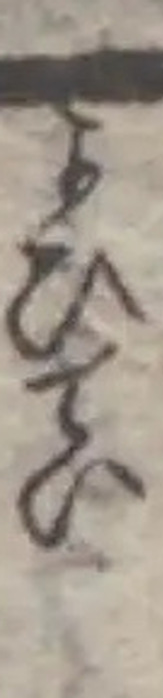よひてい
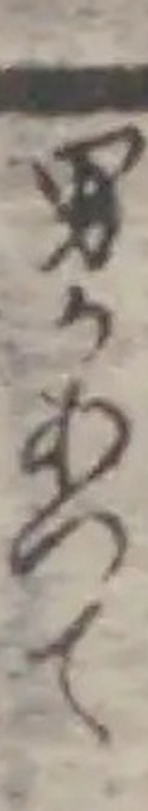男かあつて
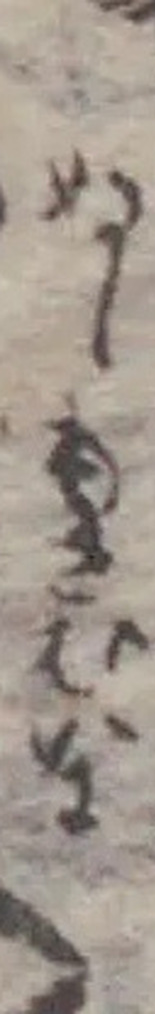ぬしもさむいに
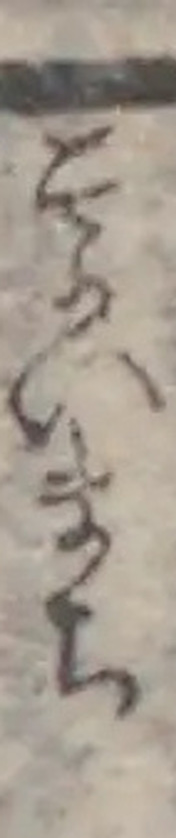こよいまち
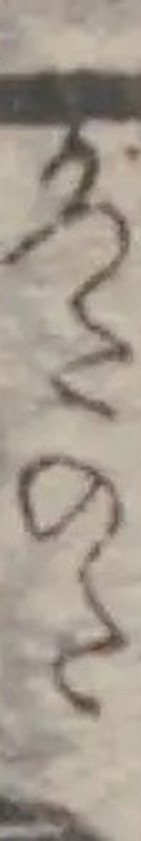がつたのた
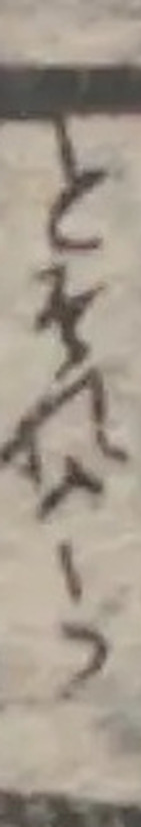とそれから
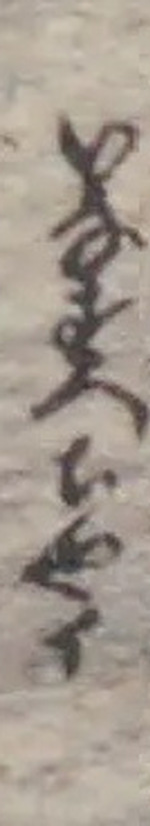いなすつちやア
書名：早出来 3巻
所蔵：国立国会図書館 National Diet Library, JAPAN
